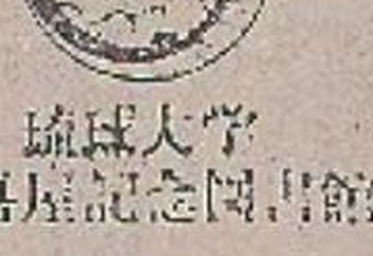琉球大学
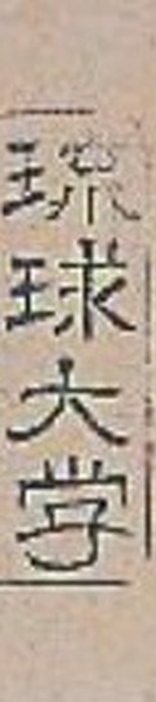琉球大学

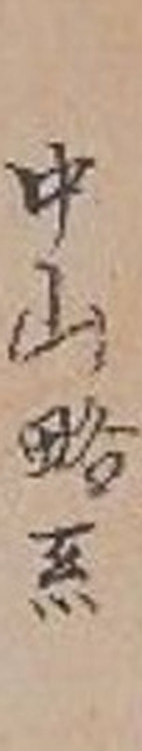中山略系
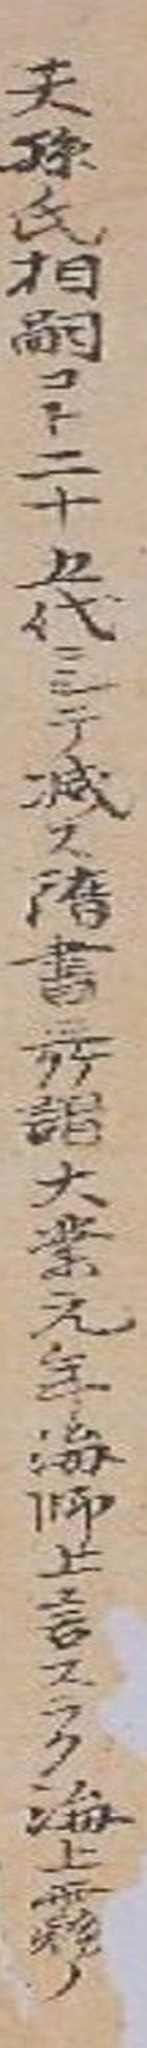天孫氏相嗣コト二十五代ニシテ滅ス隋書ニ所謂大業元年海師上言スラク海上霧ノ
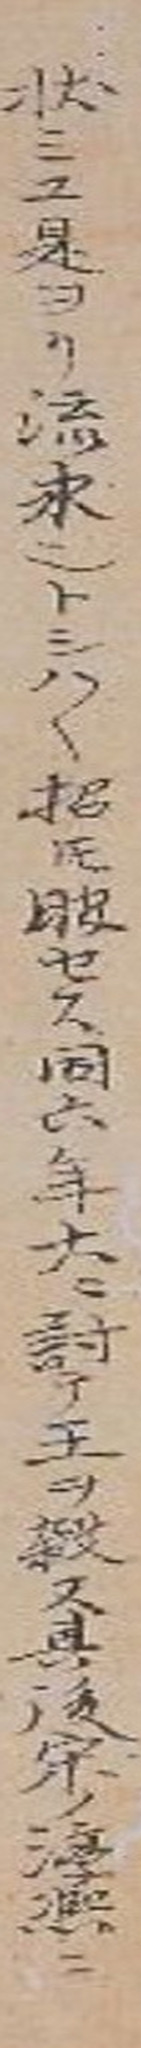状ミユ是ヨリ流求也トシハ〳〵招トモ服セス同六年大ニ討テ王ヲ殺ス其後宋ノ淳熙ニ
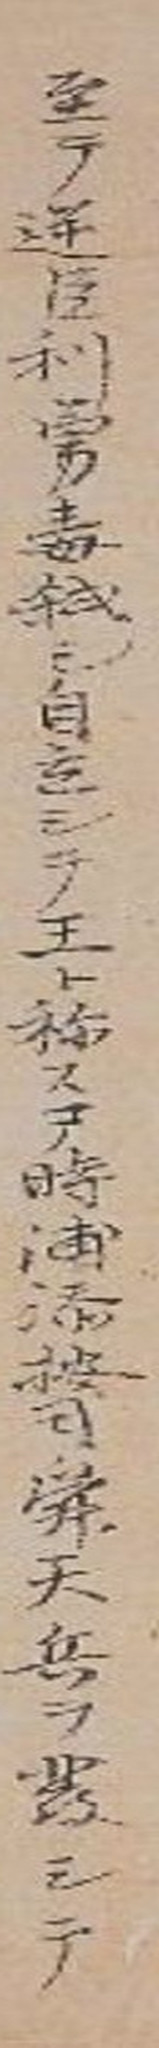至テ逆臣利勇毒弑シ自立シテ王ト称スコノ時浦添按司舜天兵ヲ発シテ
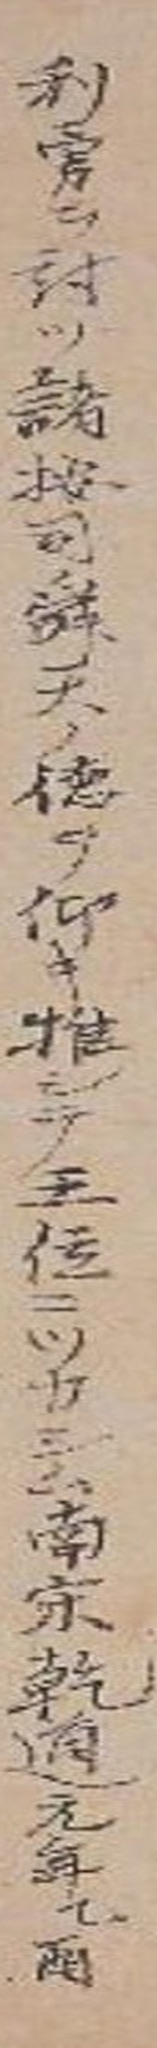利勇ヲ討ツ諸按司舜天ノ徳ヲ仰キ推シテ王位ニツカシム南宋乾道元年乙酉
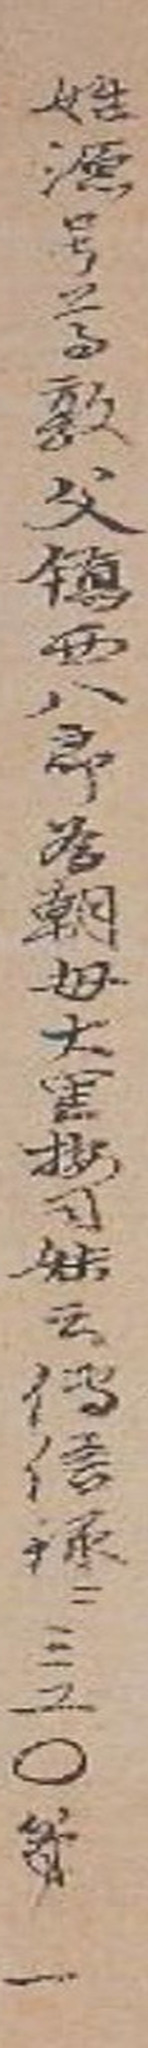姓源号尊敦父鎮西八郎為朝母大里按司妹云伝信録ニミユ〇第一
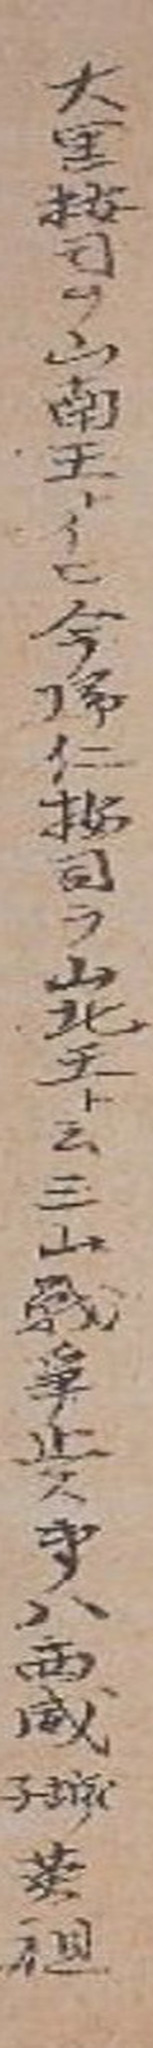大里按司ヲ山南王トイヒ今帰仁按司ヲ山北王ト云三山戦争止ス第八西威城ノ子英祖

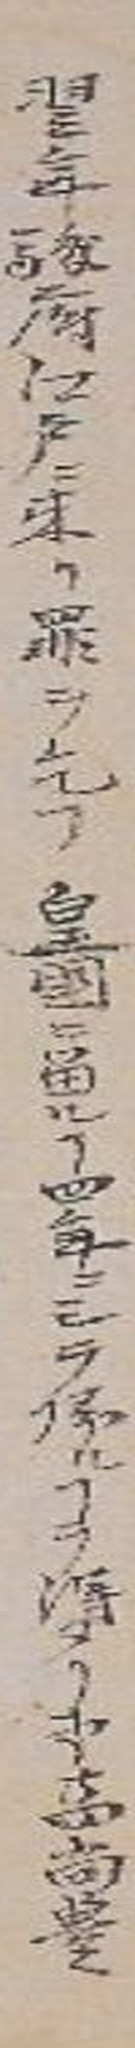翌年駿府江戸ニ来リ罪ヲ乞フ皇国ニ留ルコト四年ニシテ帰ルコトヲ得タリ第廿四尚豊
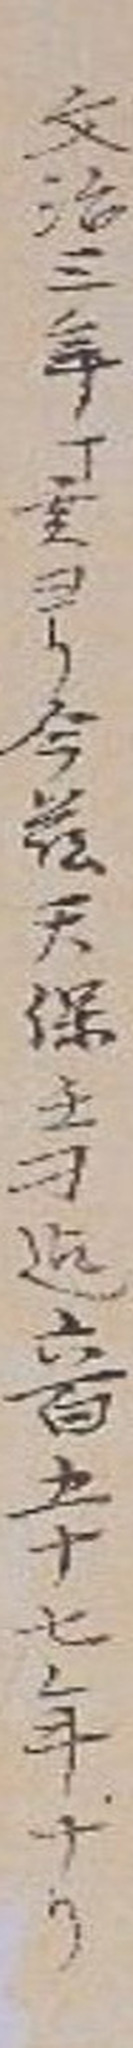文治三年丁亥ヨリ今茲天保壬寅迄六百五十七年ナリ
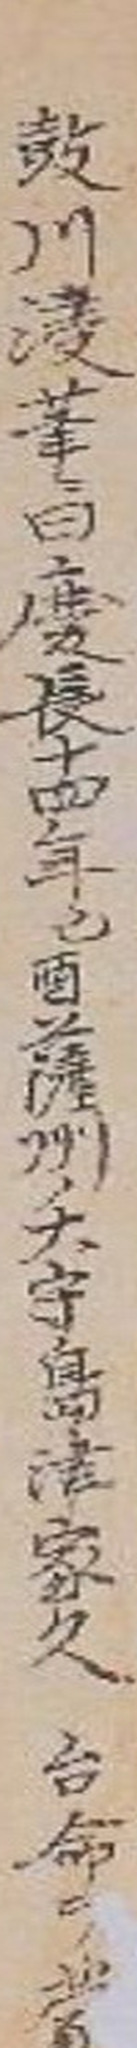鼓川淩蓬ニ曰慶長十四年己酉薩州ノ大守島津家久台命ヲ蒙リテ
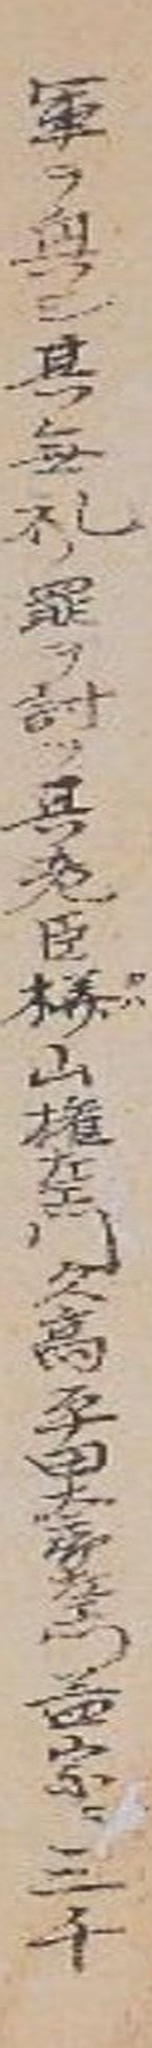軍ヲ興シ其無礼ノ罪ヲ討ツ其老臣樺山権左衛門久高平田大郎左衛門益宗ニ三千
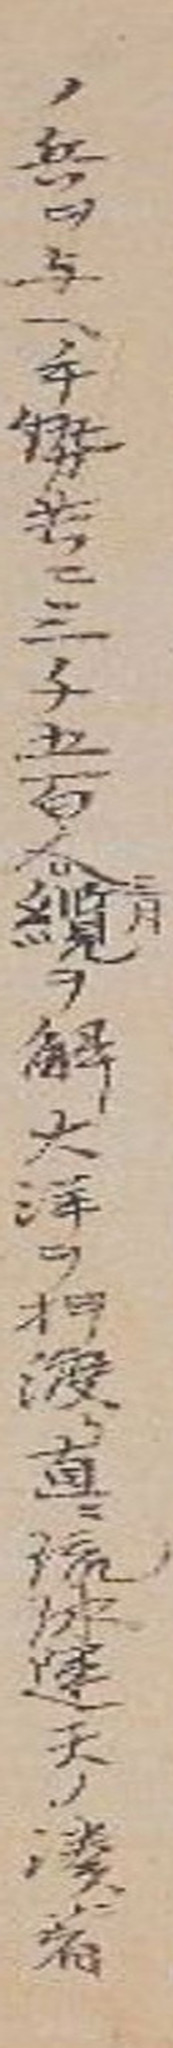ノ兵ヲ与ヘ手勢共ニ三千五百人繿ヲ解大洋ヲ押渡リ直ニ琉球運天ノ湊ニ着
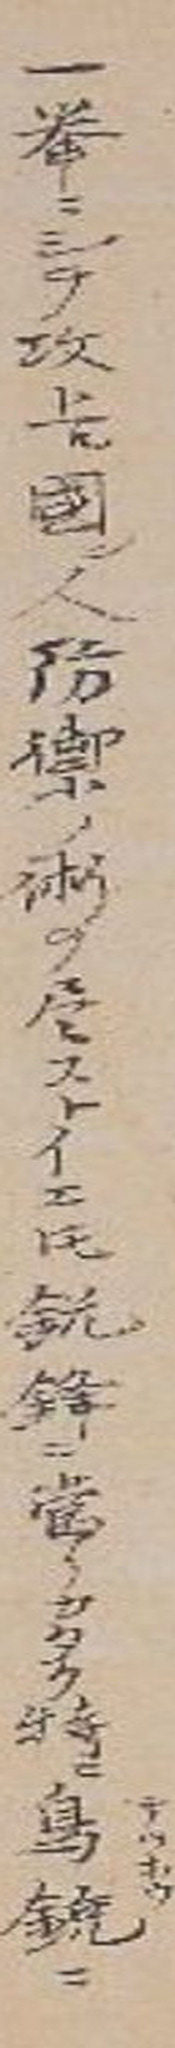一挙ニシテ攻上ル国之人防禦ノ術ヲ尽ストイエトモ鋭鋒ニ当リカタク特ニ鳥銃ニ
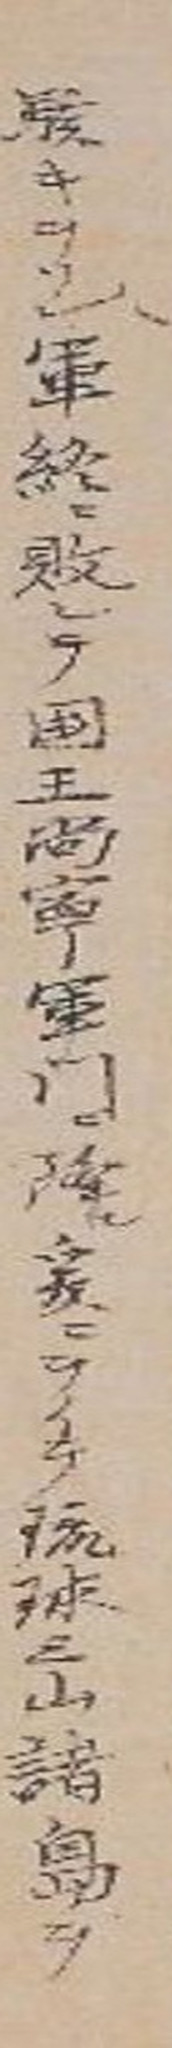駭キヲリ也、軍終ニ敗レテ国王尚寧軍門ニ降ル爰ニヲイテ琉球三山諸島ヲ
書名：琉球来聘志(仮) 天保十三年
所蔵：University of the Ryukyus Library
